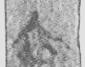六
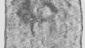十
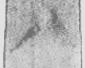八
